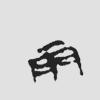雨
